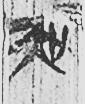吳
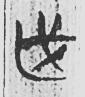戉
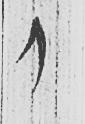人
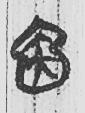因
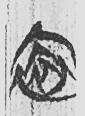{衣衣}
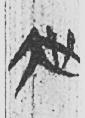吳
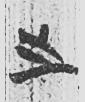之
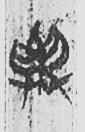與
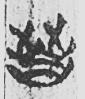晉
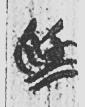爲
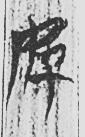好
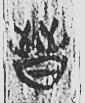晉
